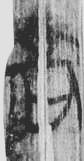高
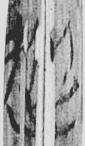從
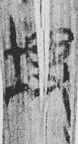埤
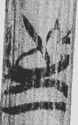至
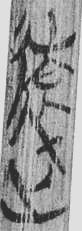遠
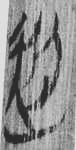從
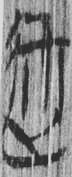迩（邇）
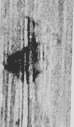十
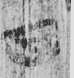回（圍）
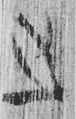之
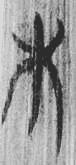木
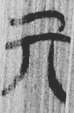亓（其）
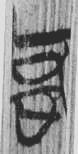○（始）
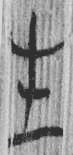生
